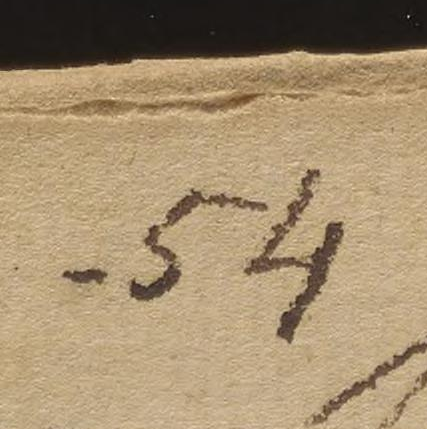54
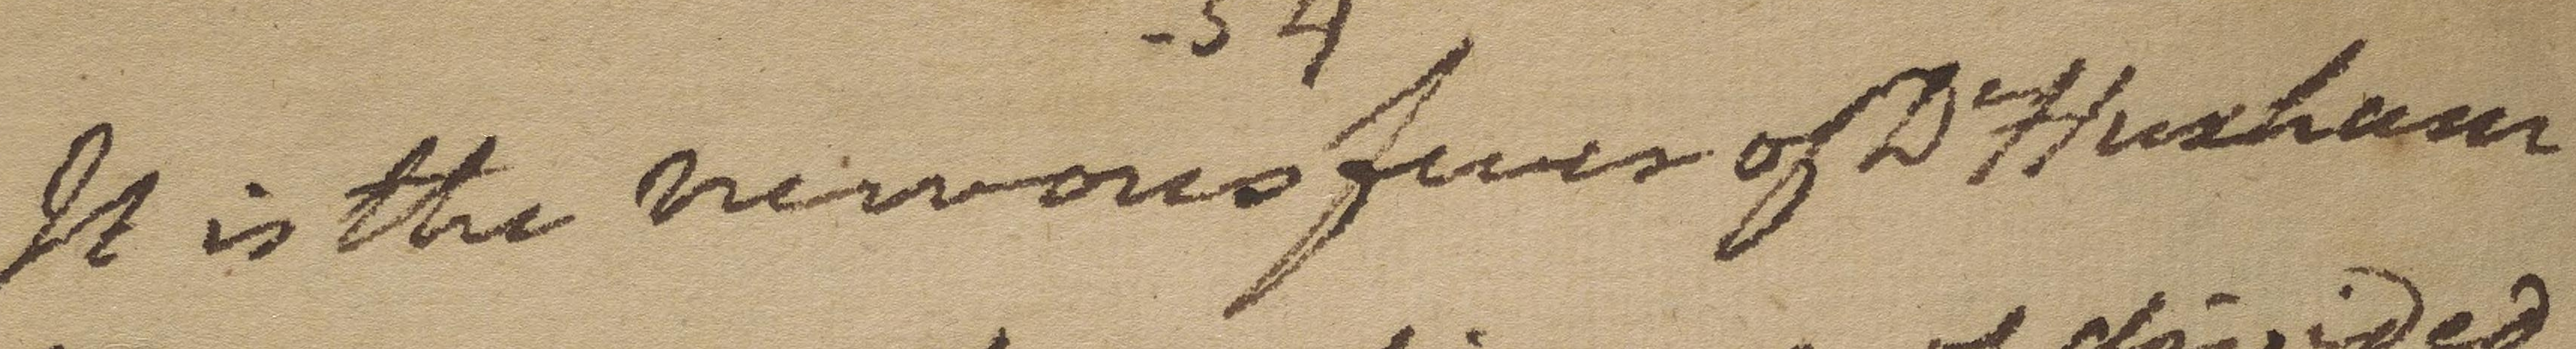It is the nervous fever of D^r Huxham.
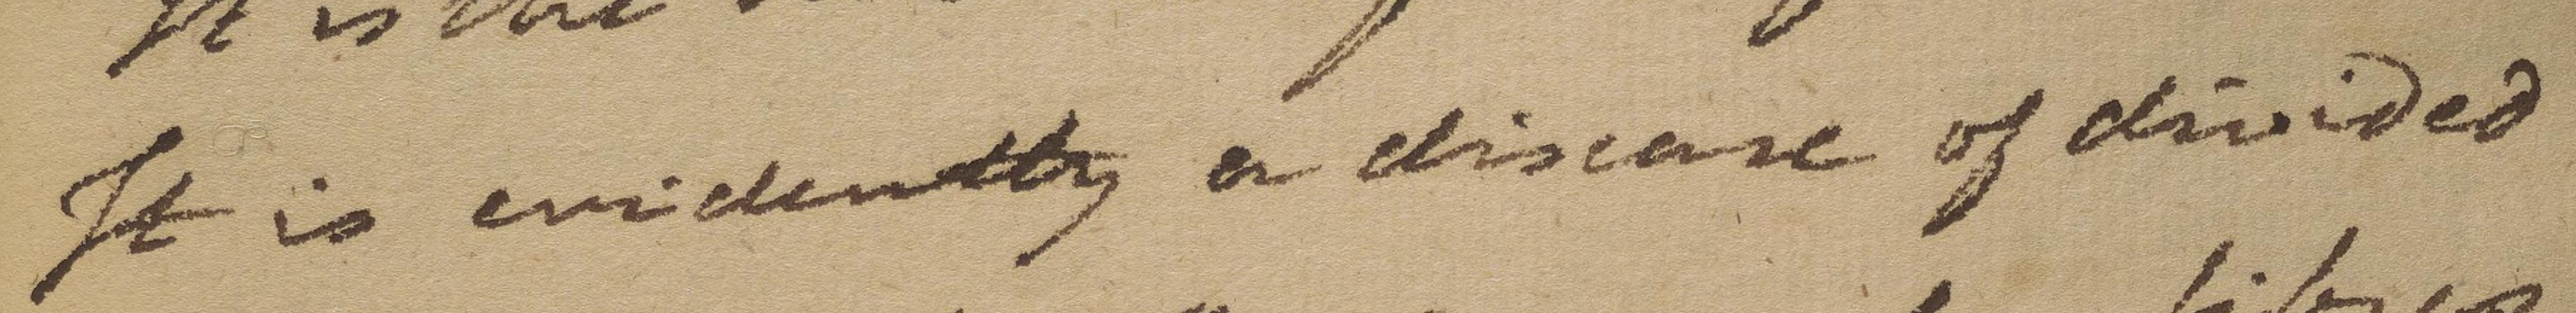It is evidently a disease of divided
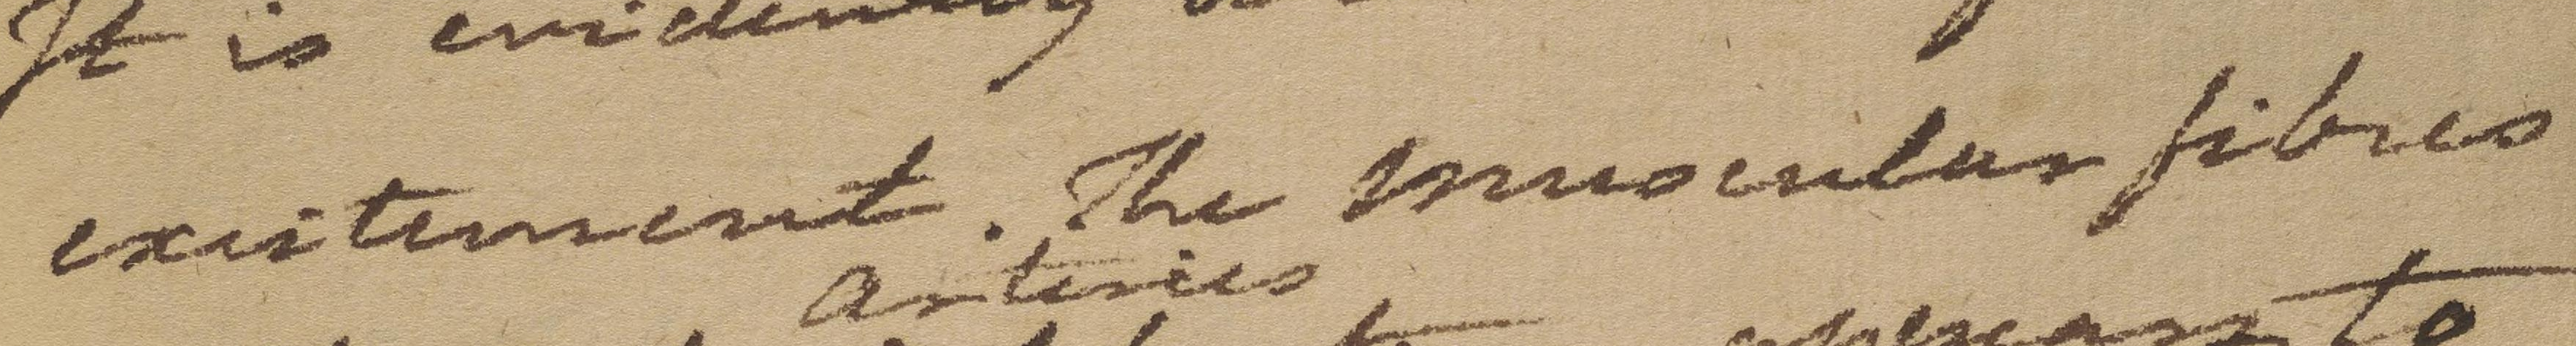excitement. The muscular fibres
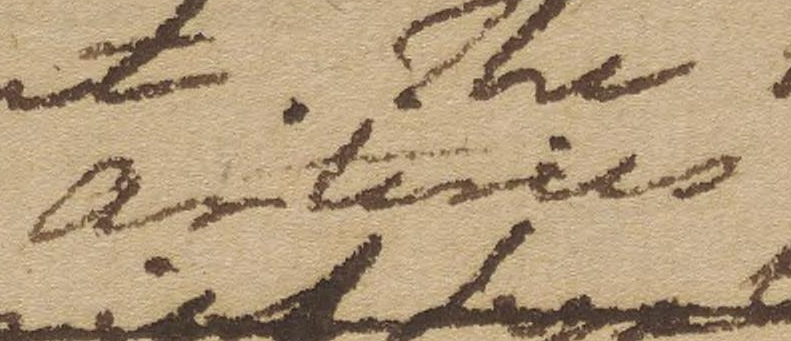arteries
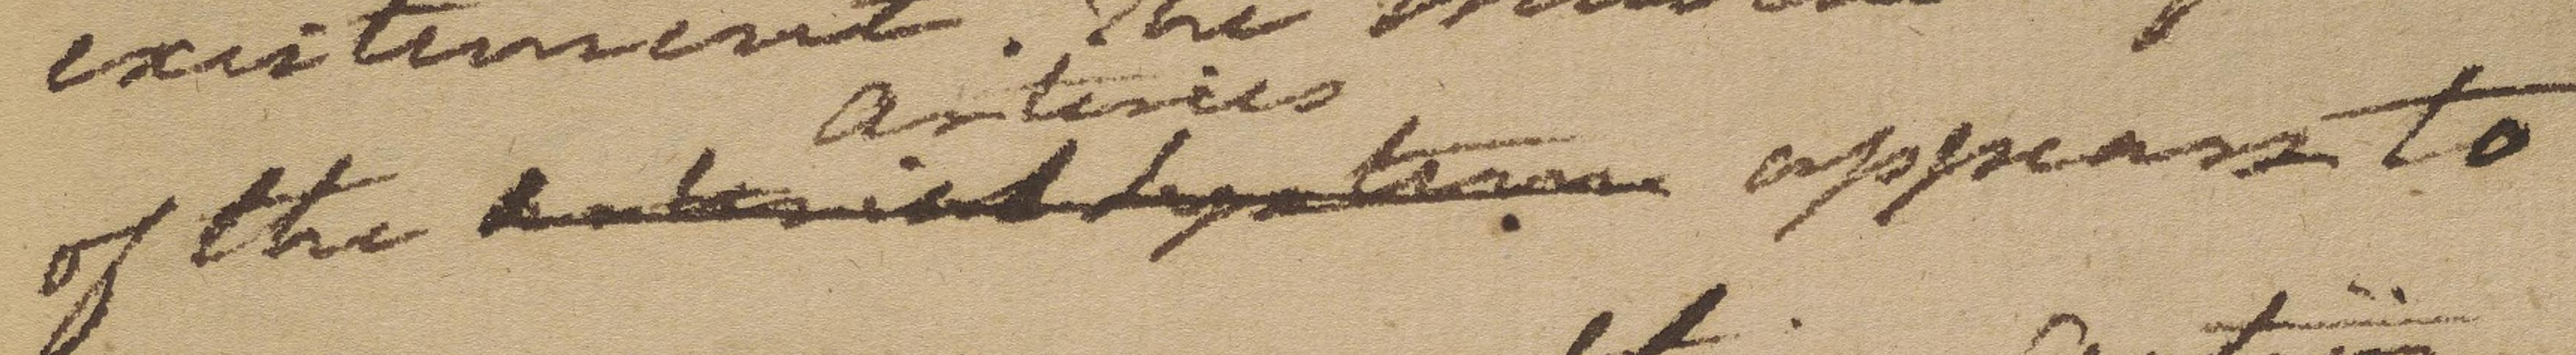of the [arterial system] appears to
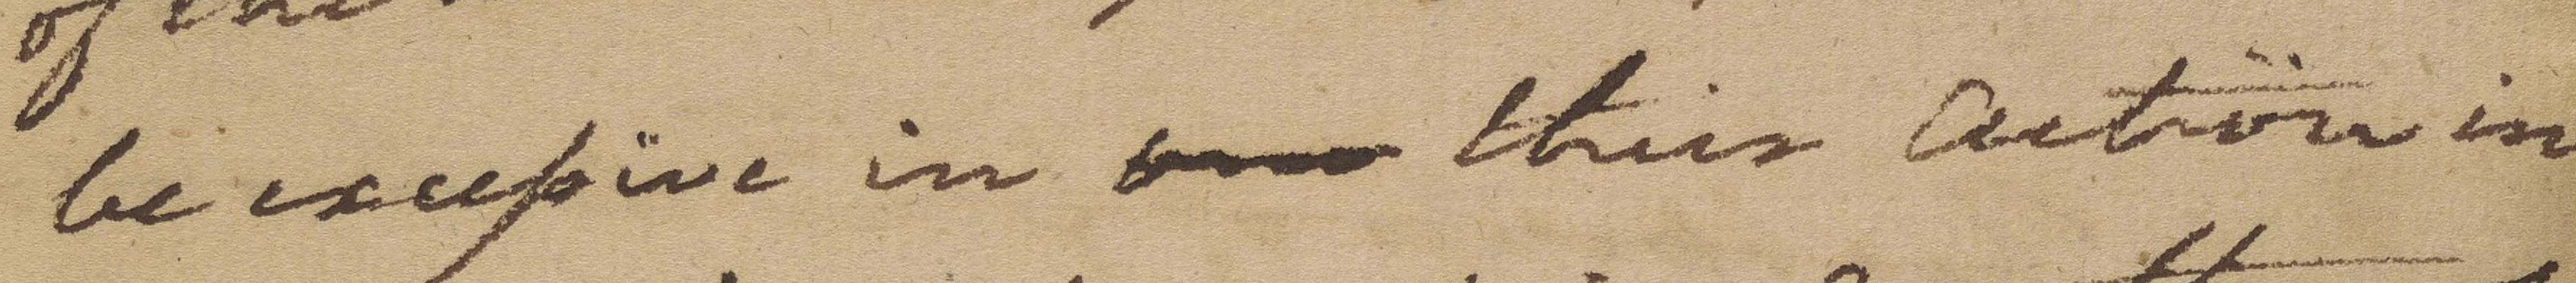be excessive in [one] their action in
